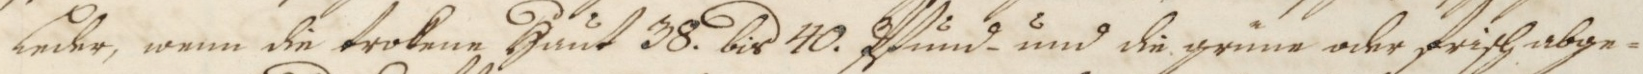Leder, wenn die trokene Haut 38. bis 40. Pfund- und die grüne oder frisch abge-
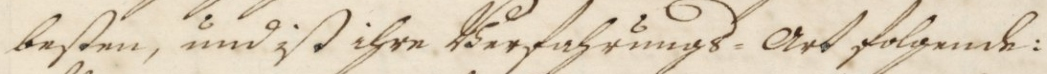besten, und ist ihre Verfahrungs- Art folgende:
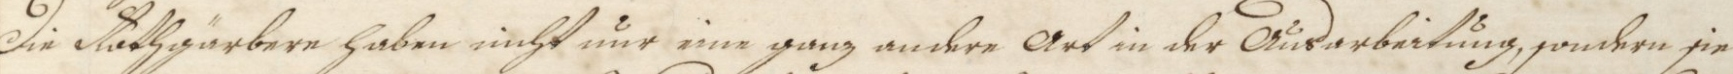Die Rothgärbere haben nicht nur eine ganz andere Art in der Ausarbeitung, sondern sie
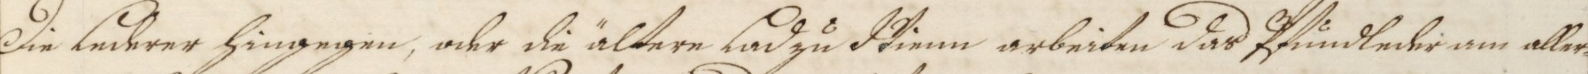Die Lederer hingegen, oder die ältere Lad zu Wienn arbeiten das Pfundleder am aller
